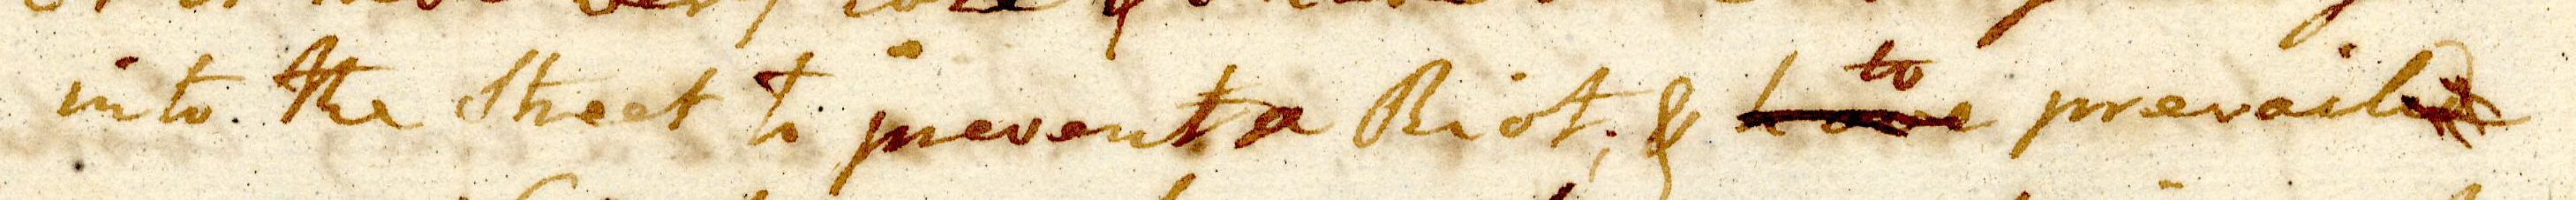into the Street to prevent a Riot; & [have] to prevail[d]
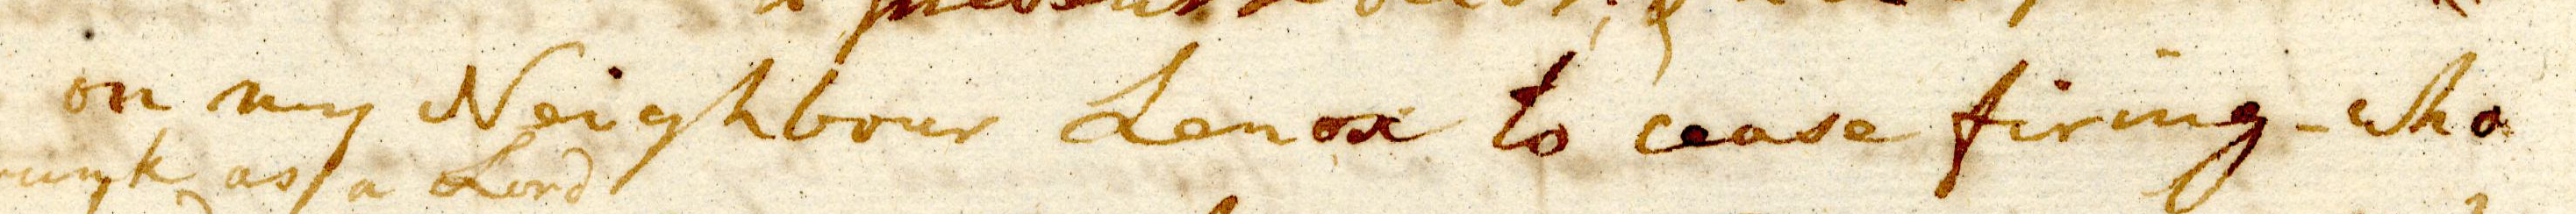on my Neighbour Lenox to cease firing- who
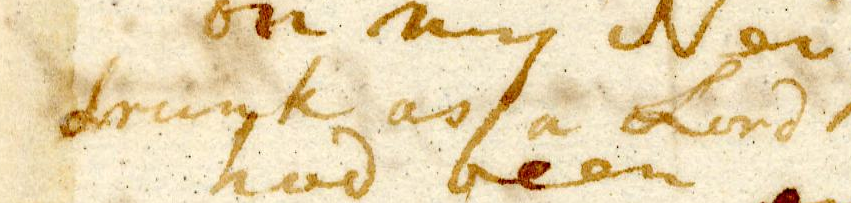drunk as a Lord
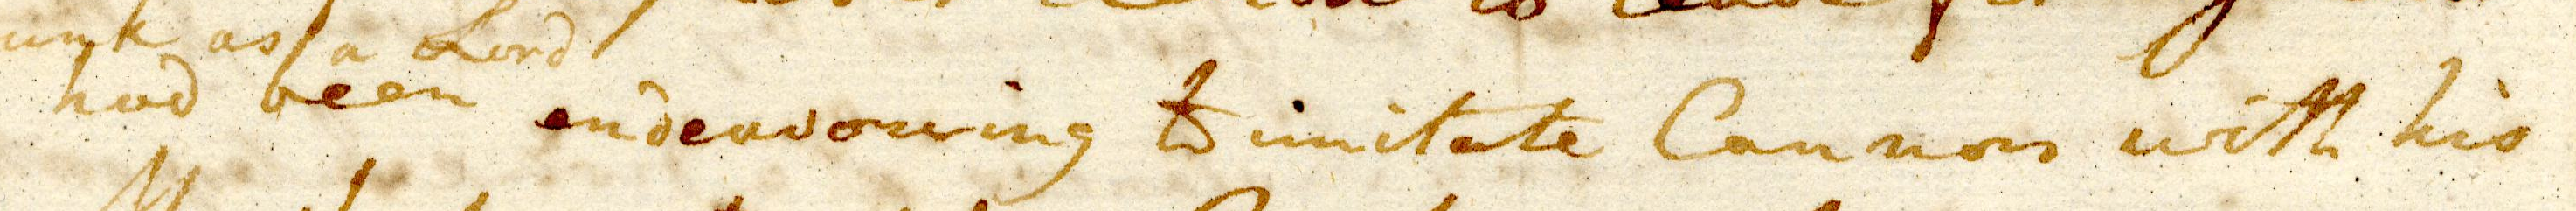had been endeavouring to imitate Cannon with his
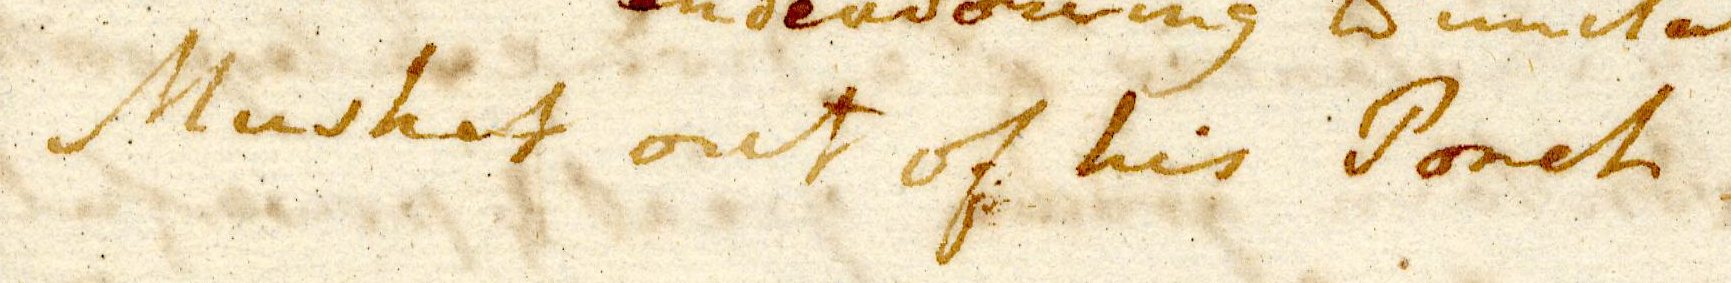Musket out of his Porch
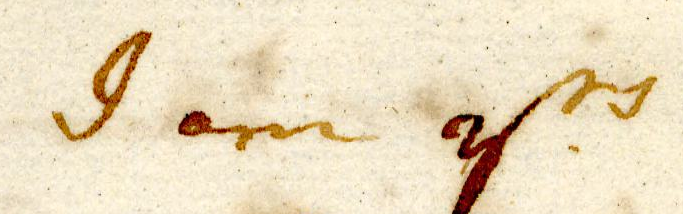I am y^rs.
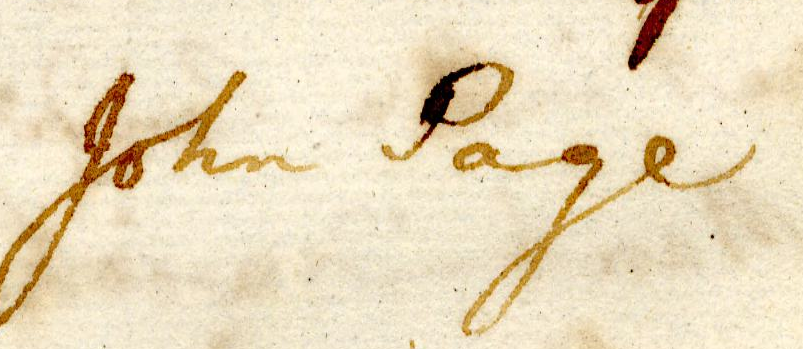John Page
